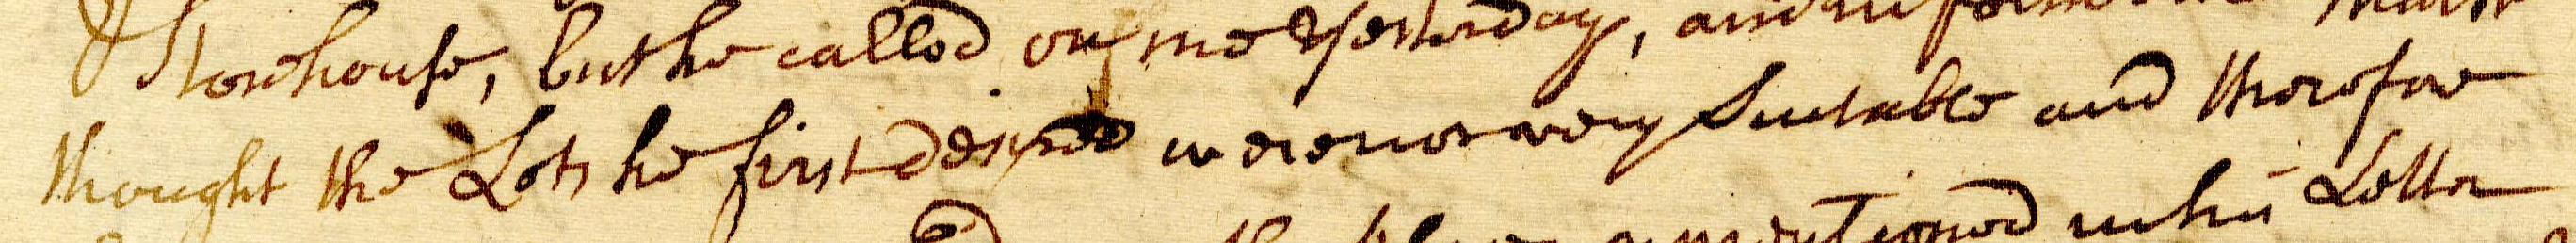thought the Lots he first desired were not very suitable and therefor
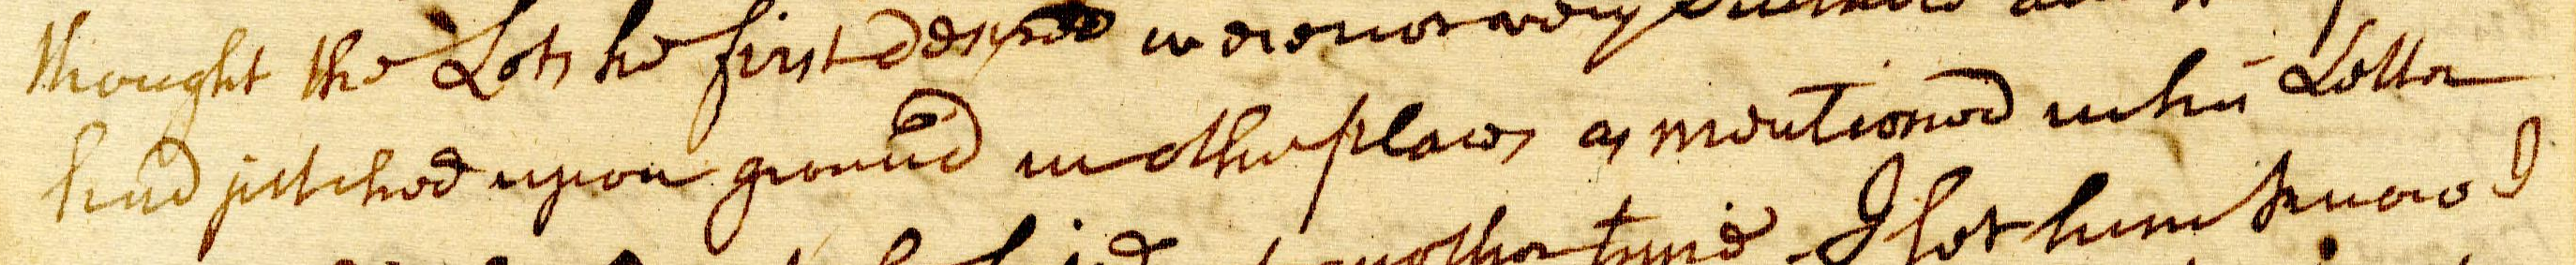find pitched upon ground in other places as mentioned in his Letter
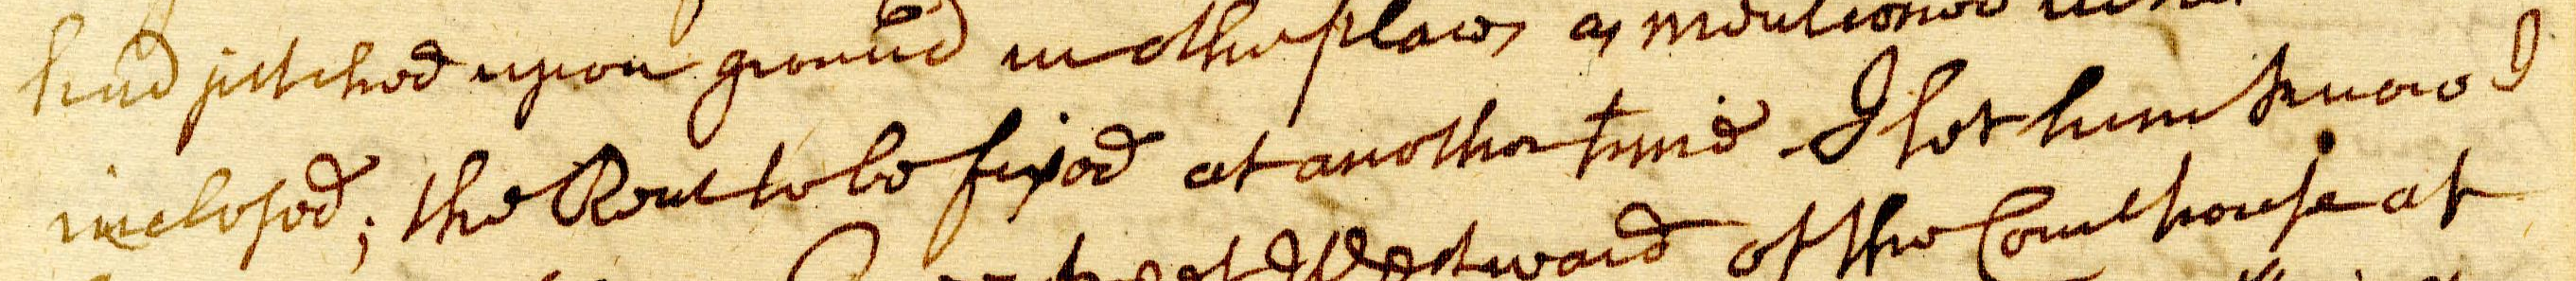inclosed; the Rent to be fixed at another time. I let him know I
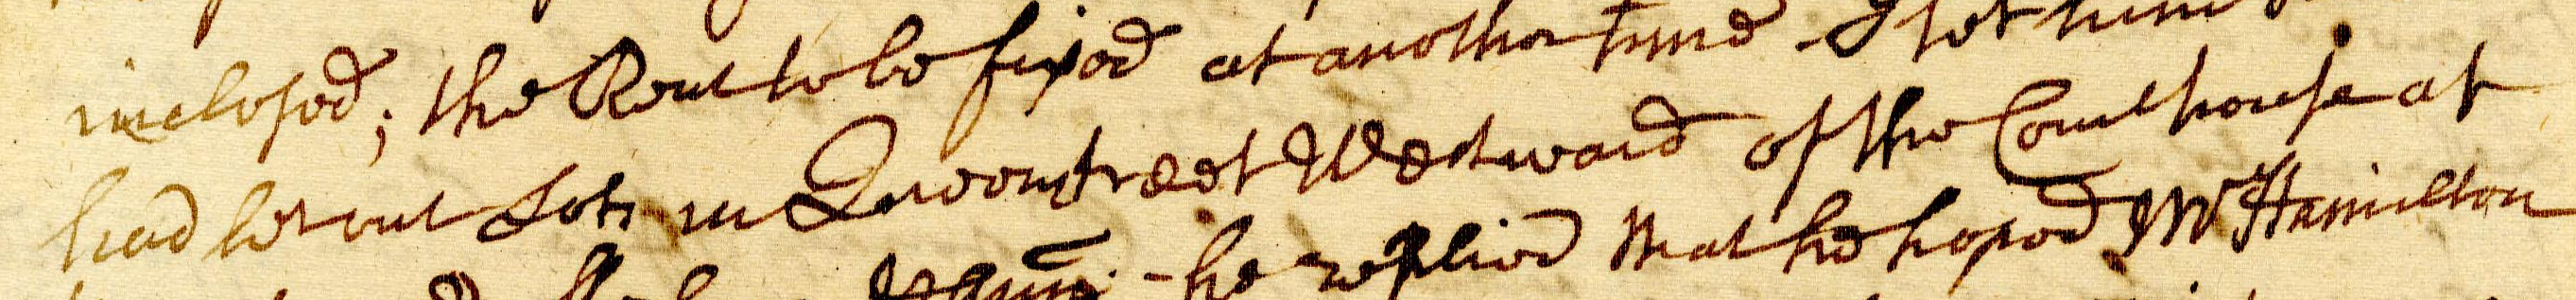had let out Lots in Quartre Westward of the Courthouse at
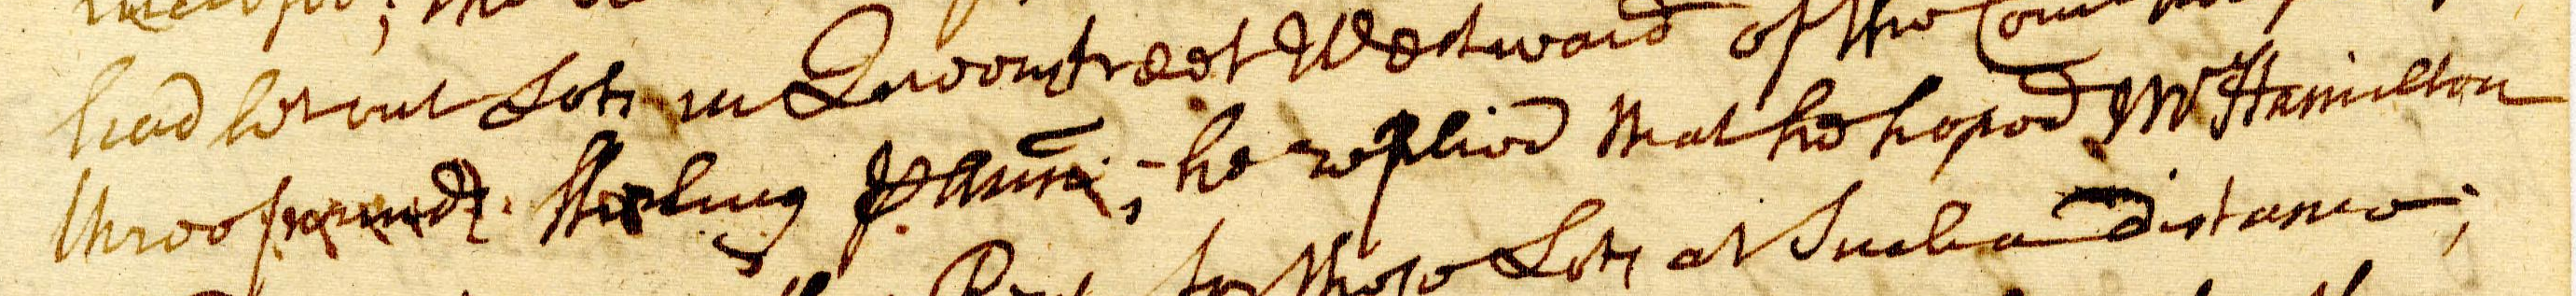three [_____]. Shilling per Ann., -he replied that he hoped M^r Hamilton
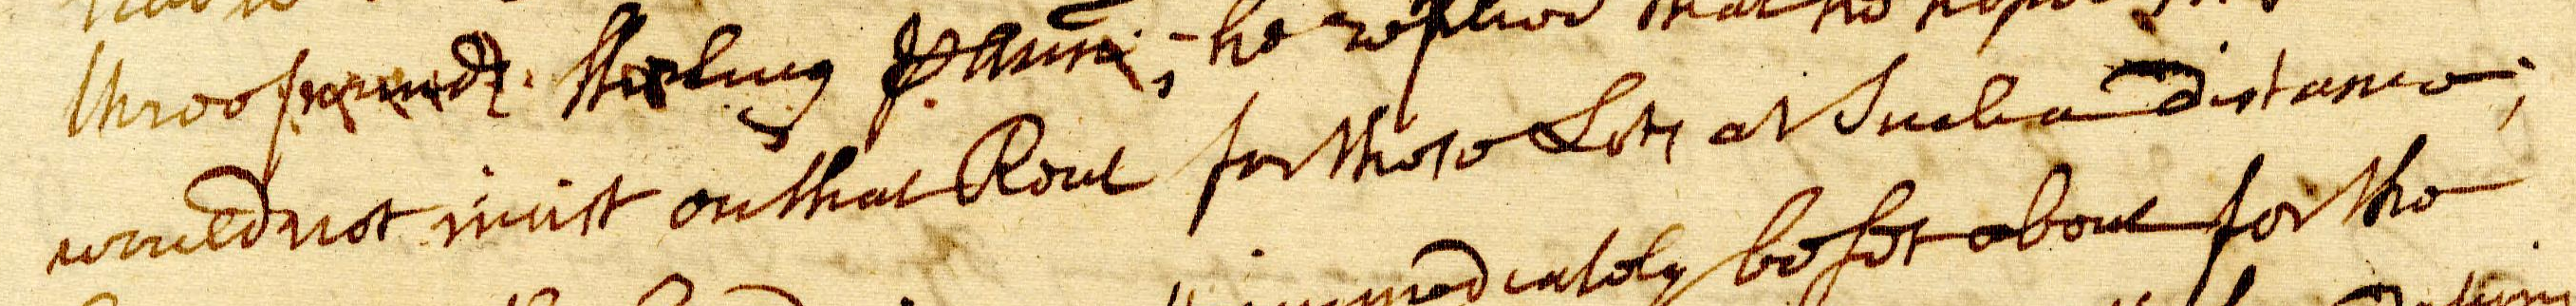would not insist on that Rent for these Lots at such a distance;
